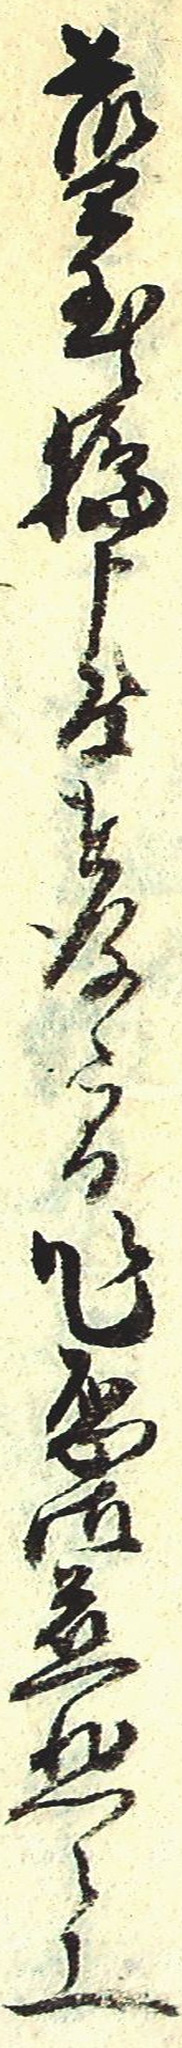藍玉に搗申度奉存候間乍恐御慈悲之上
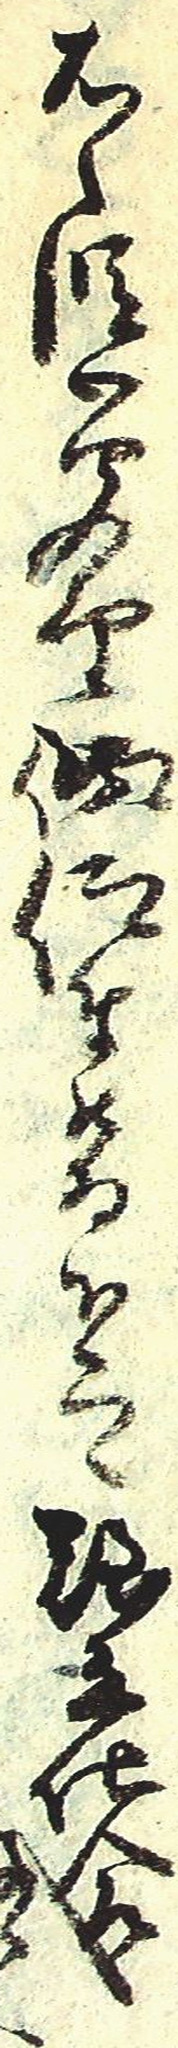右之段御聞届被仰付被為下候はゝ難有仕合に
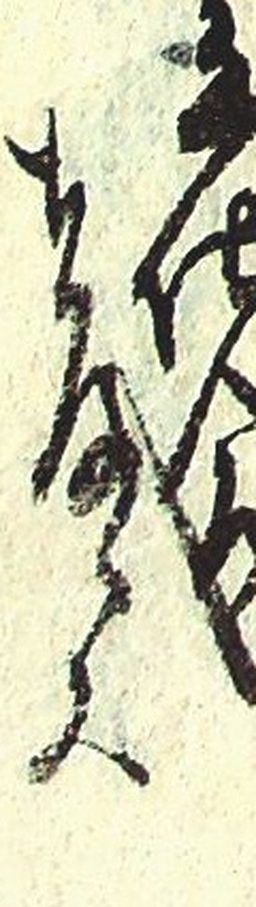奉存候以上

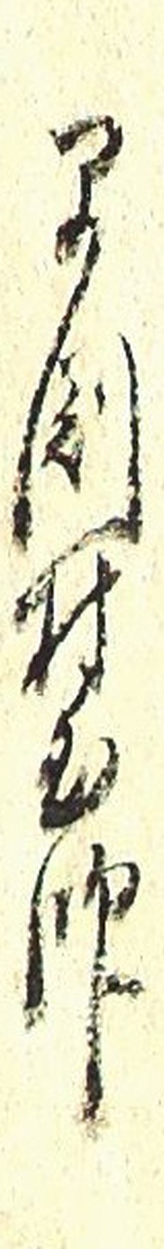早淵村玉師
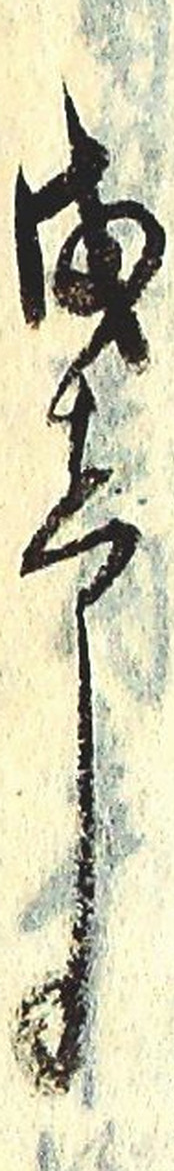戌十一月
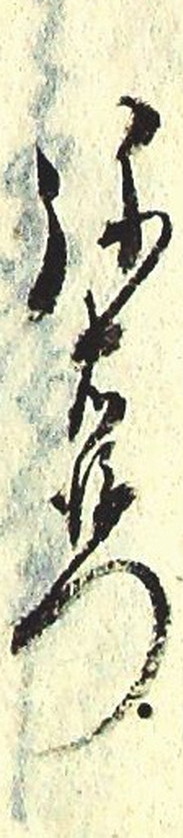弥右衛門
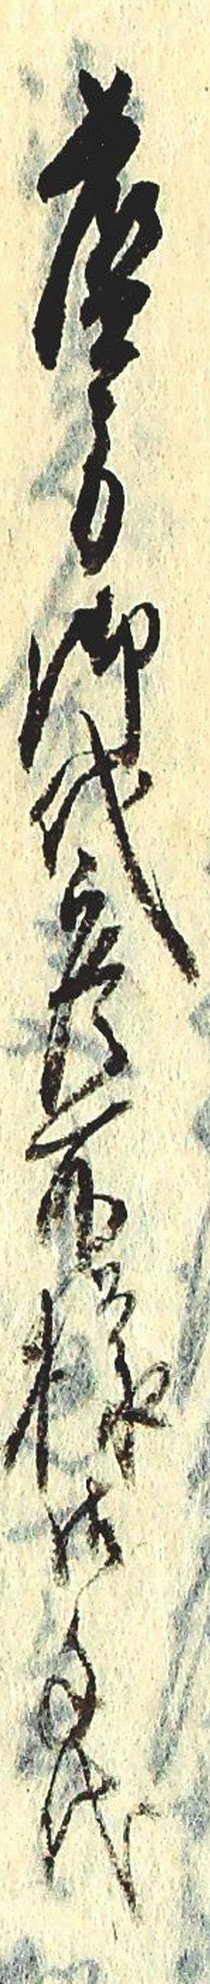藍方御代官所様御手代
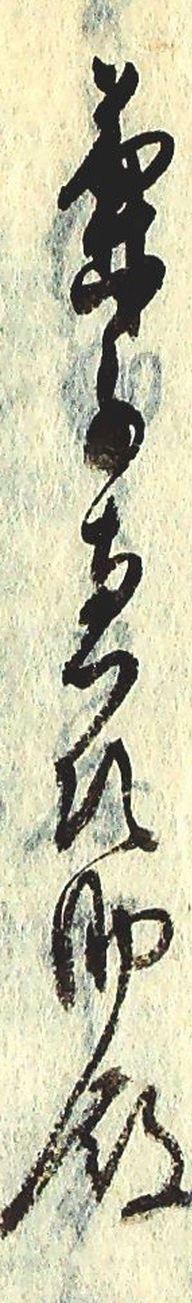兼子恵次助殿
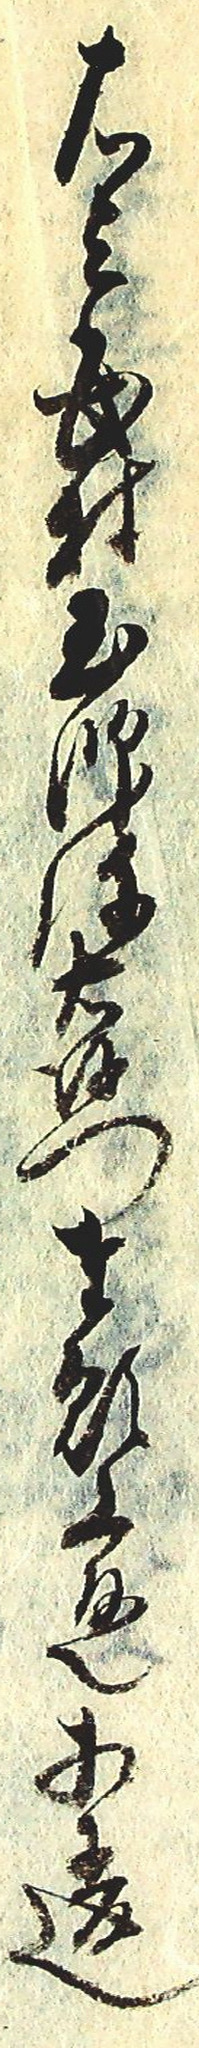右は当村玉師弥右衛門奉願上通相違
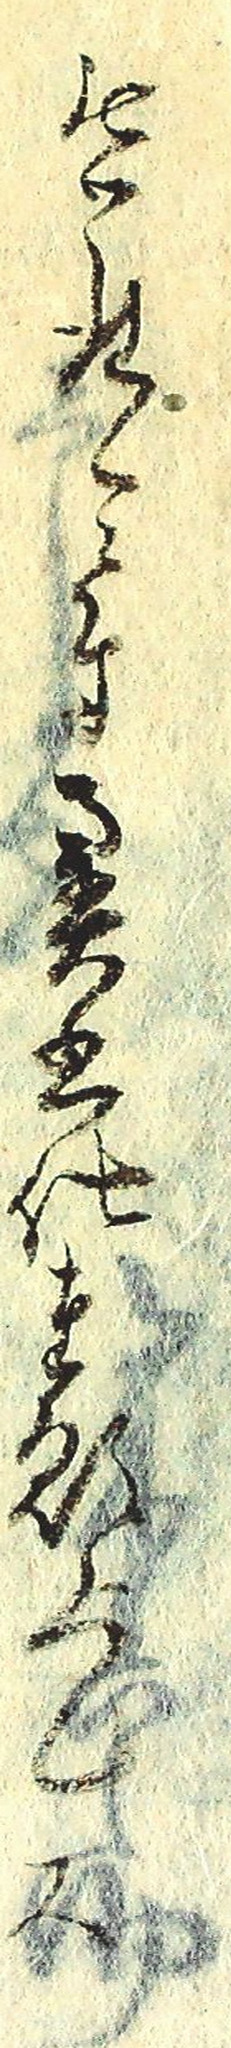無御座候に付奥書仕奉願上候以上
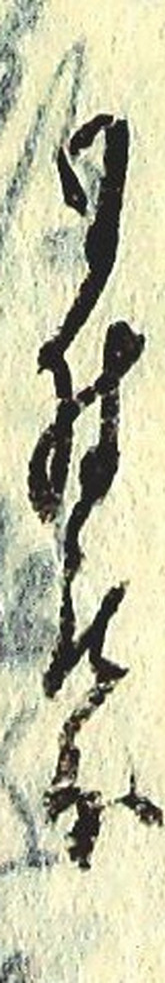同村庄屋
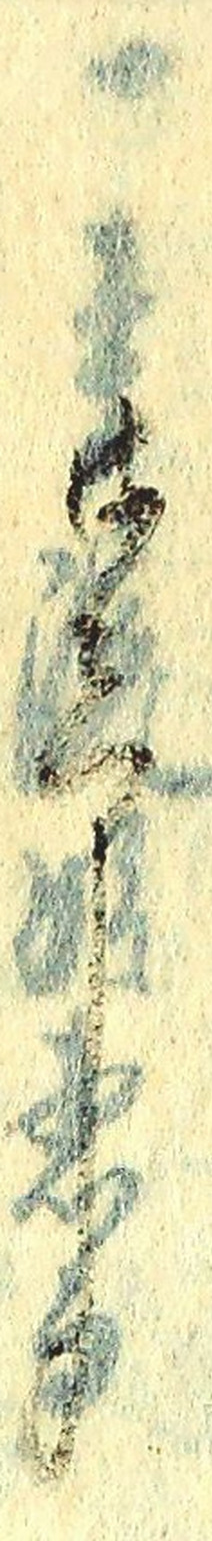戌十一月
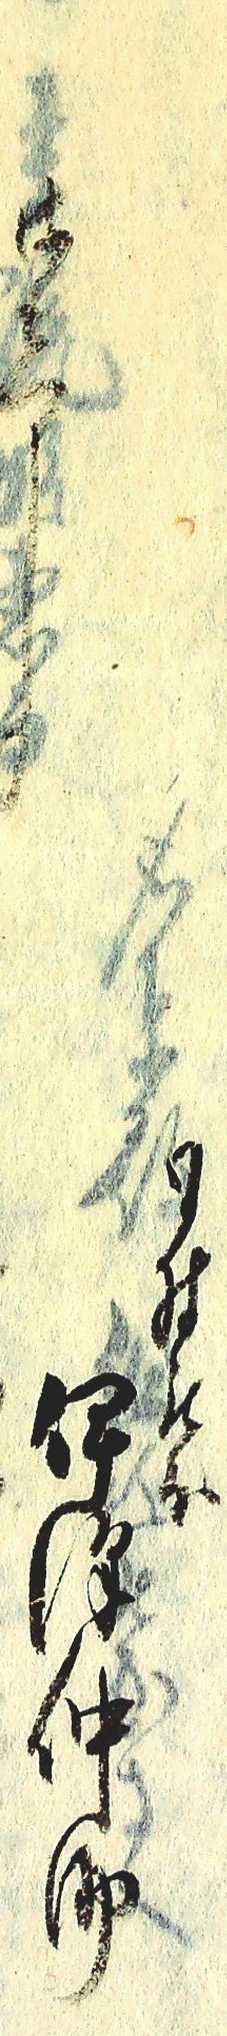伊沢仲助
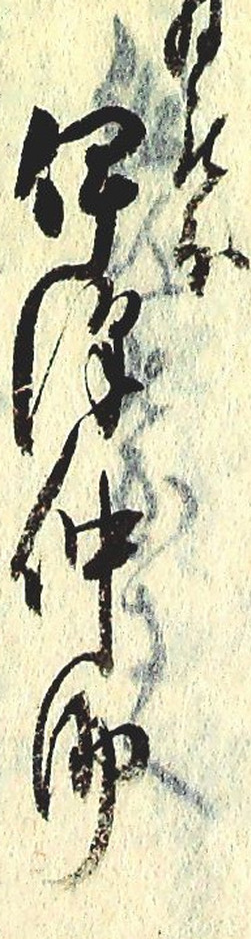伊沢仲助
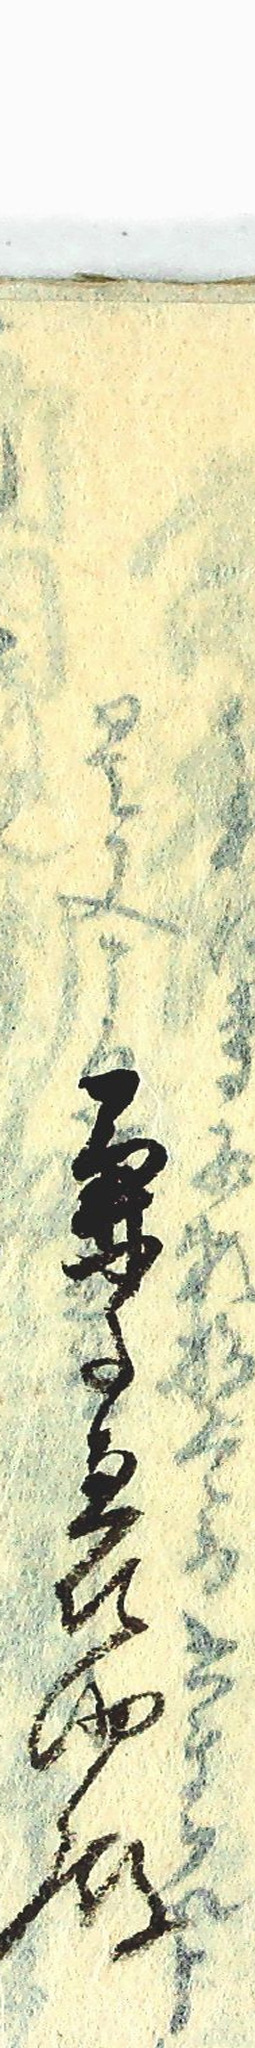兼子恵次助殿
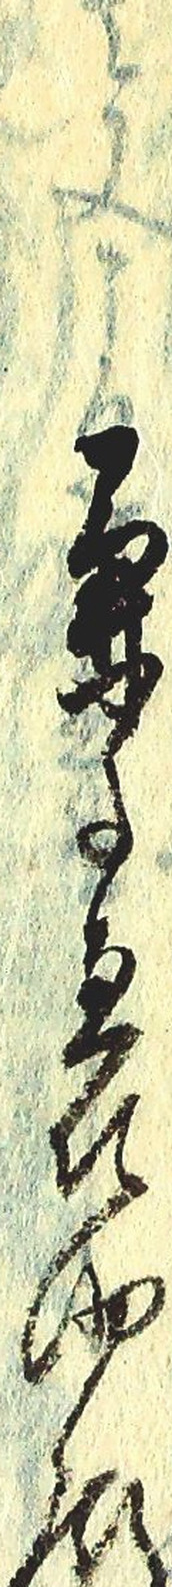兼子恵次助殿
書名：諸御願書控(弐番）
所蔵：鳴門教育大学 Naruto University of Education
